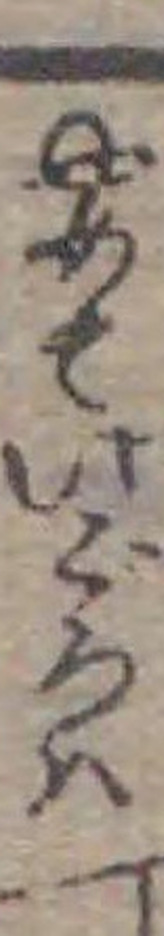やめて此ごろは
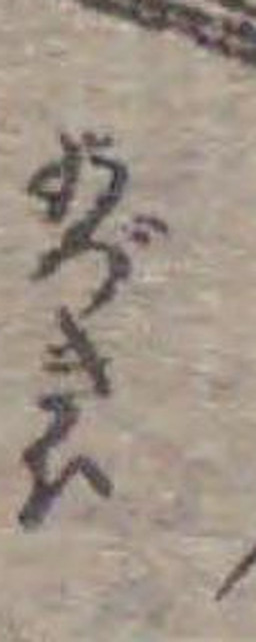あづきは
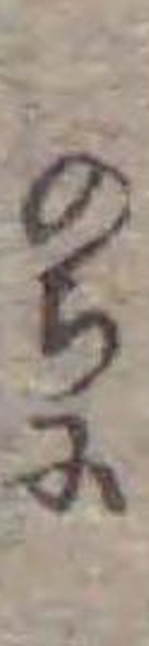のちに
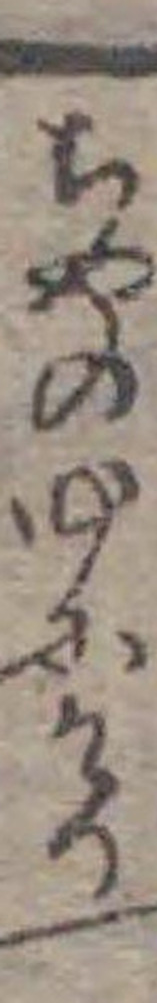ちやのゆにかゝり
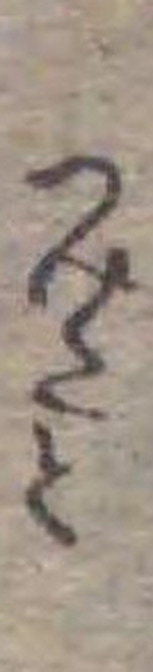つけたと
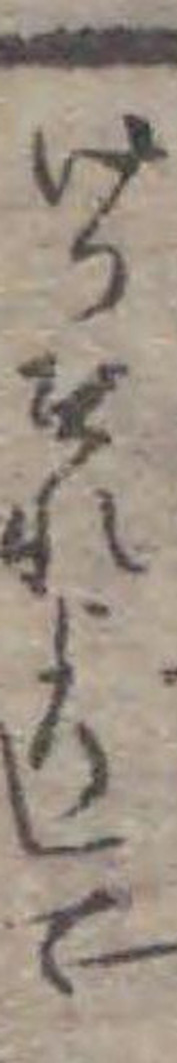けりそれよりして
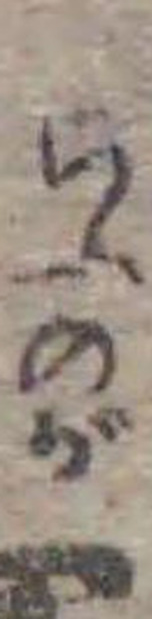いふのが
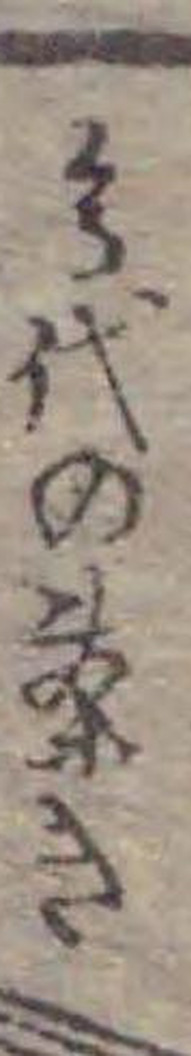高代の茶き
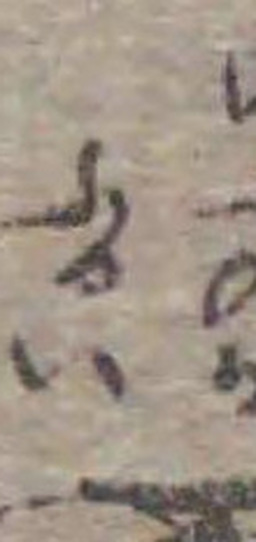ふるい
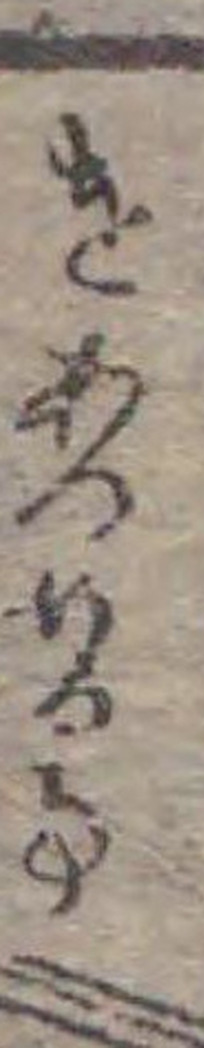をあつめる事
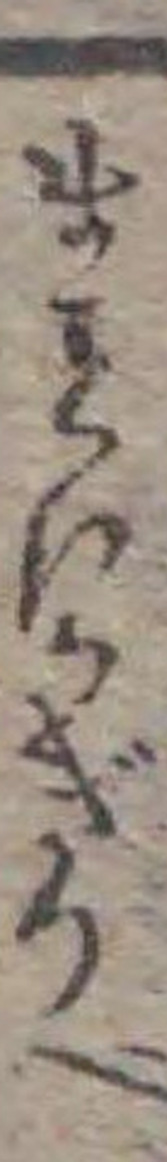まことかぎり
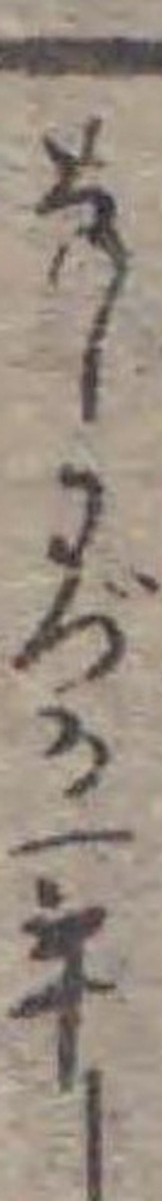なしわづか一年
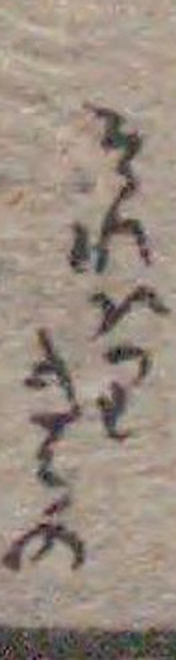それはり
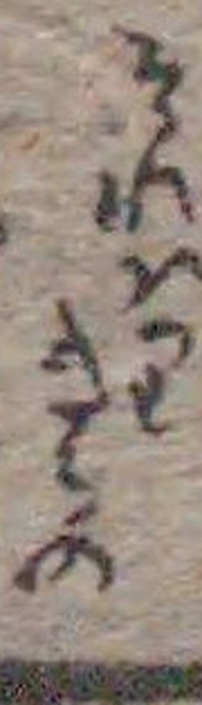きうの
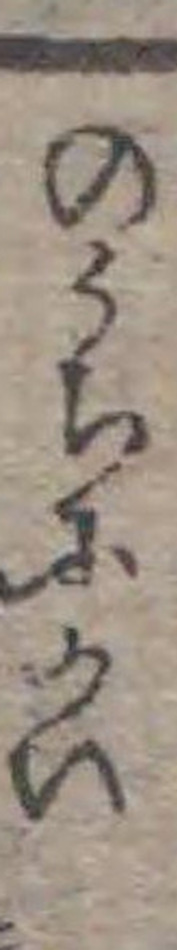のうちにかい
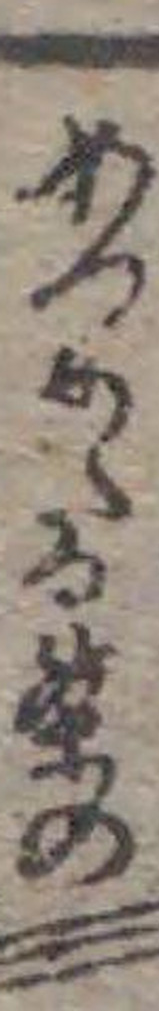あつめたる茶の
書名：見徳一炊夢 : 3巻
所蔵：国立国会図書館 National Diet Library, JAPAN
